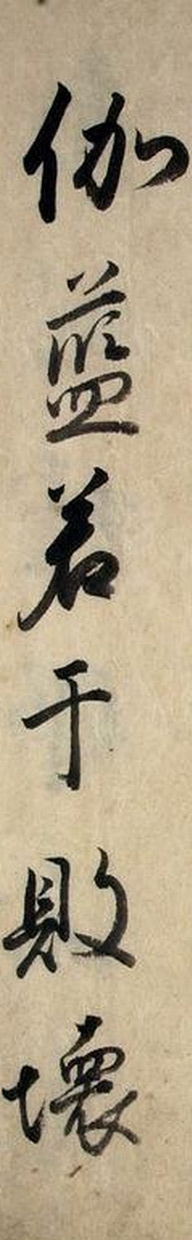伽藍若干敗壊

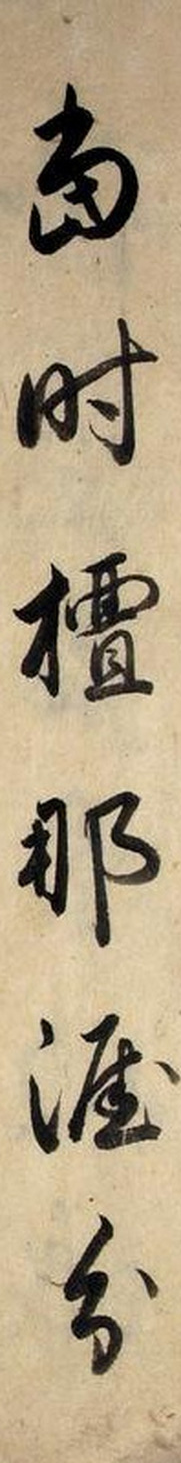当時旦那涯分
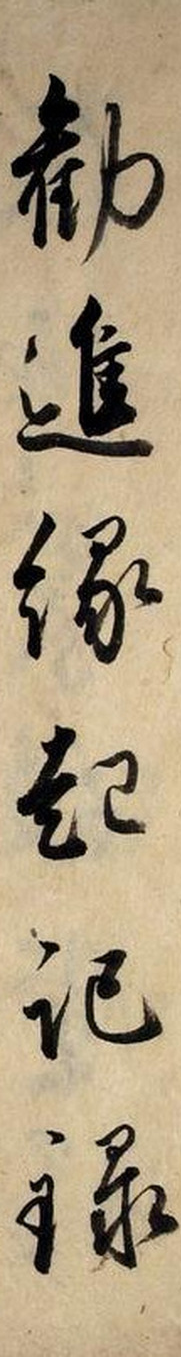勧進縁起記録
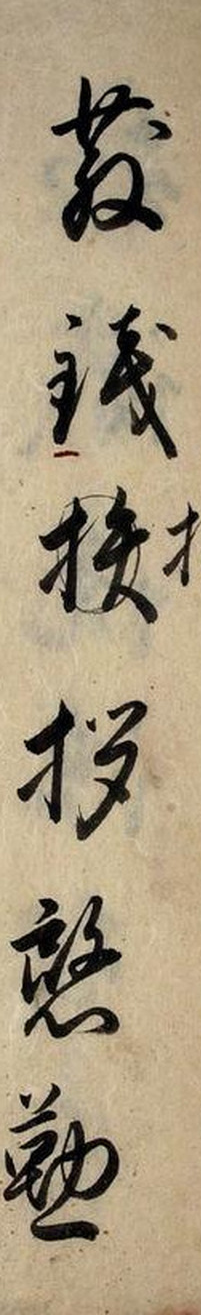散銭挨拶慇懃
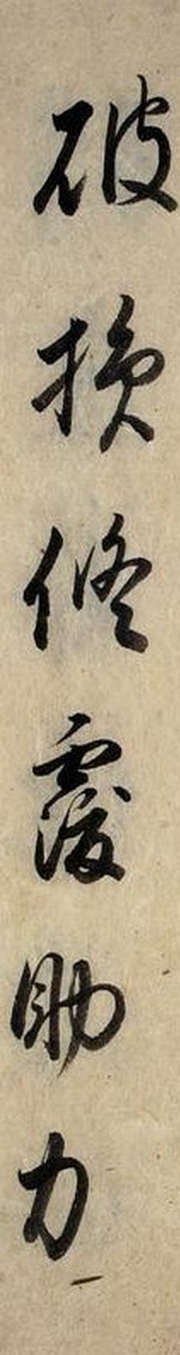破損修覆助力
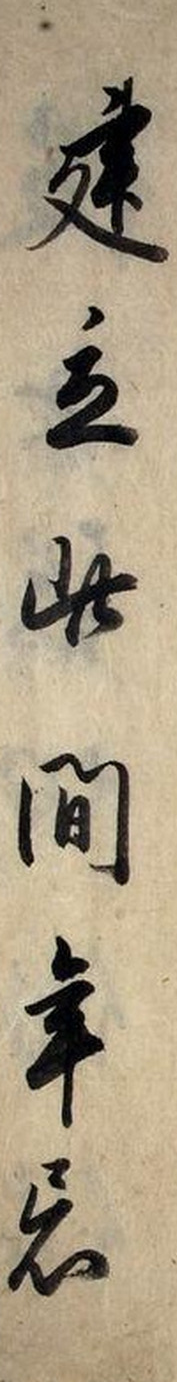建立此間年忌

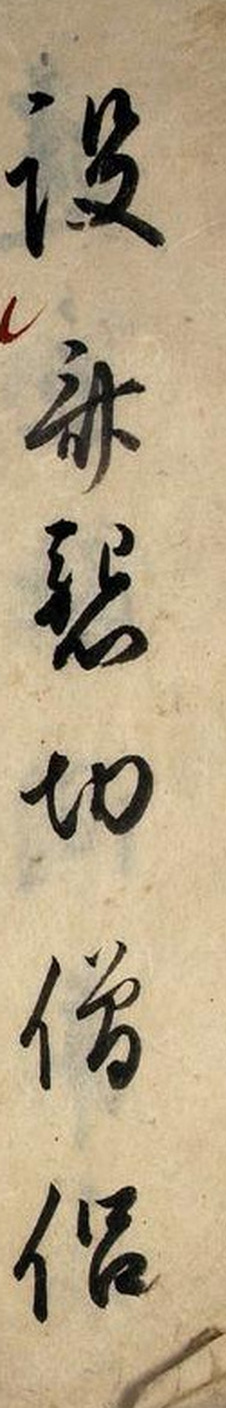設斎懇切僧侶
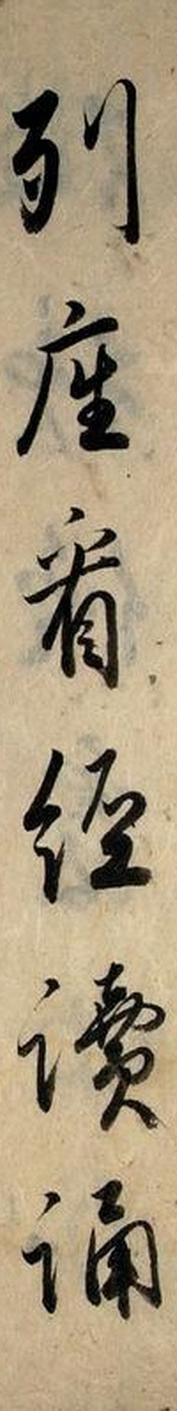列座看経読誦
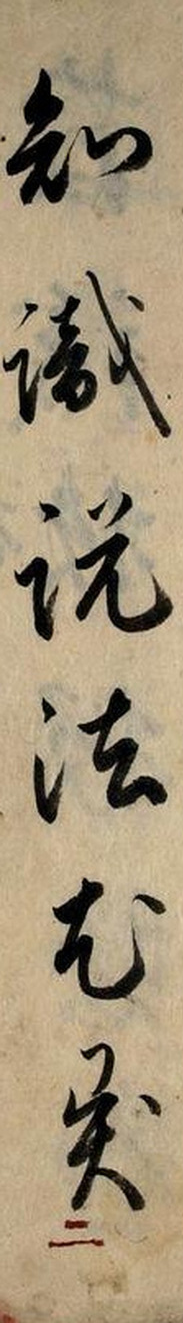知識説法尤異
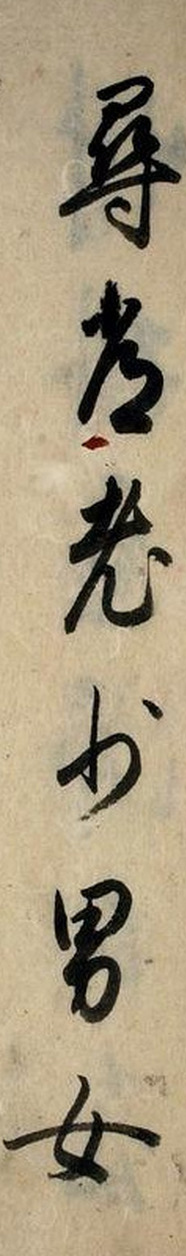尋常老少男女
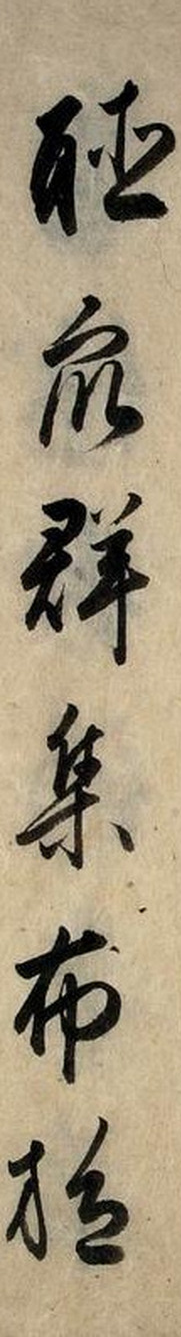聴衆群集布施
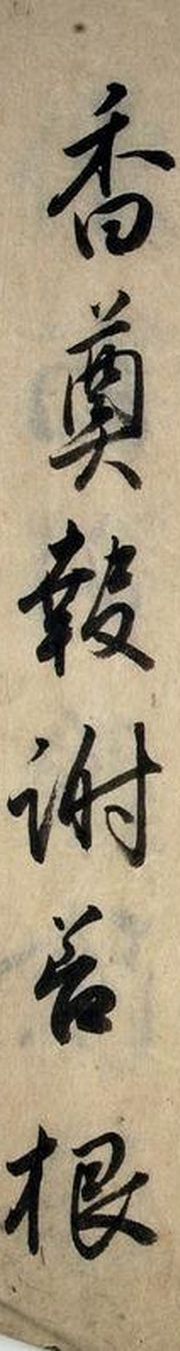香奠報謝善根

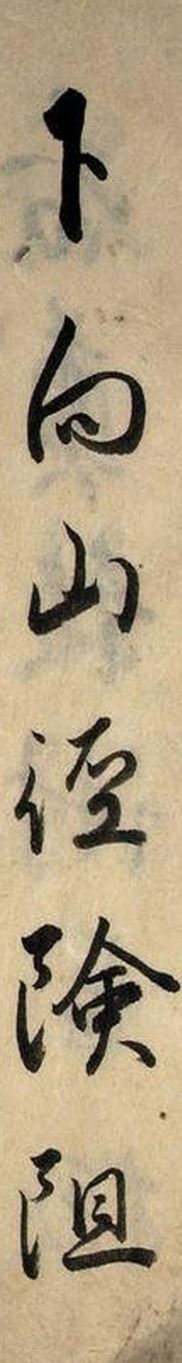下向山径険阻
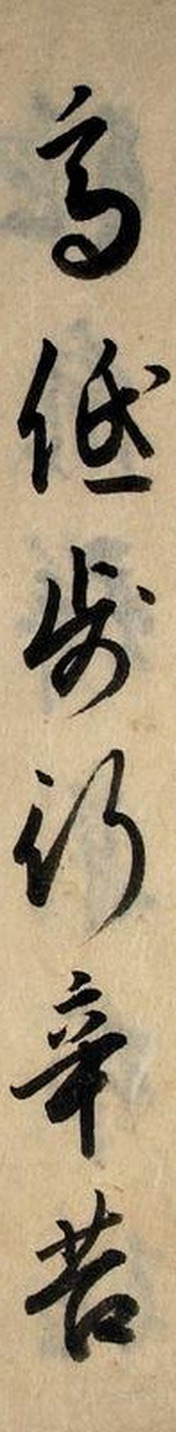高低歩行辛苦
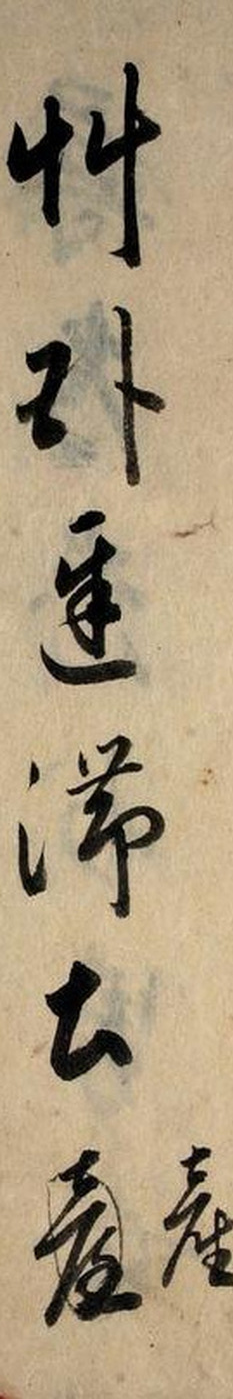草臥遅滞土産
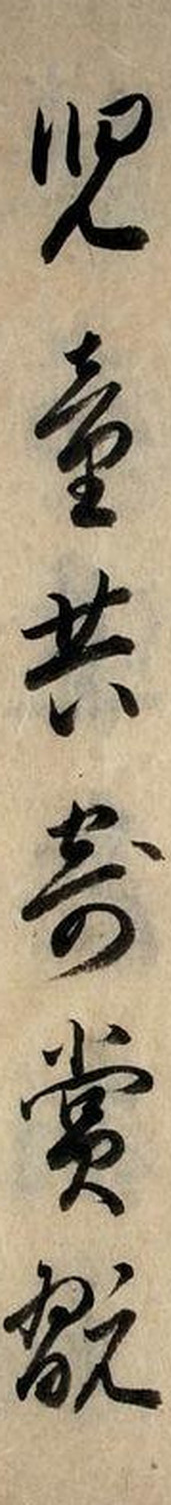児童共寄賞翫
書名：世話千字文（手習手本）
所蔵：福井県文書館 Fukui Prefectural Archives
